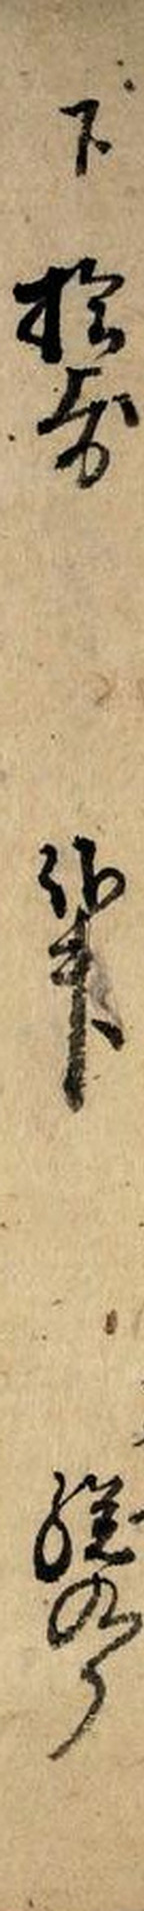下拾歩弐升孫九郎
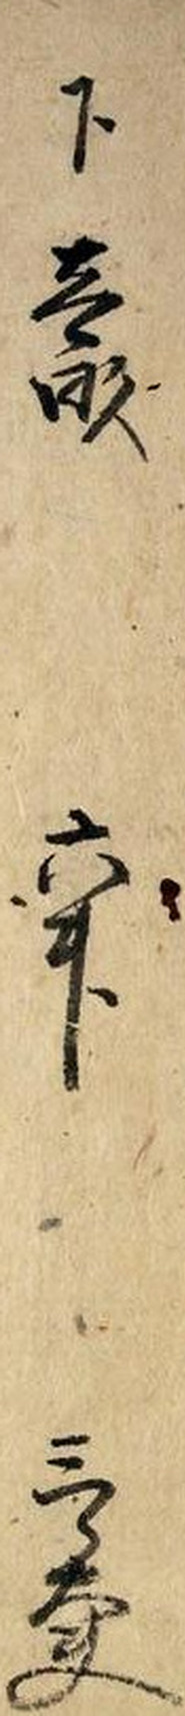下壱畝六升三郎大夫
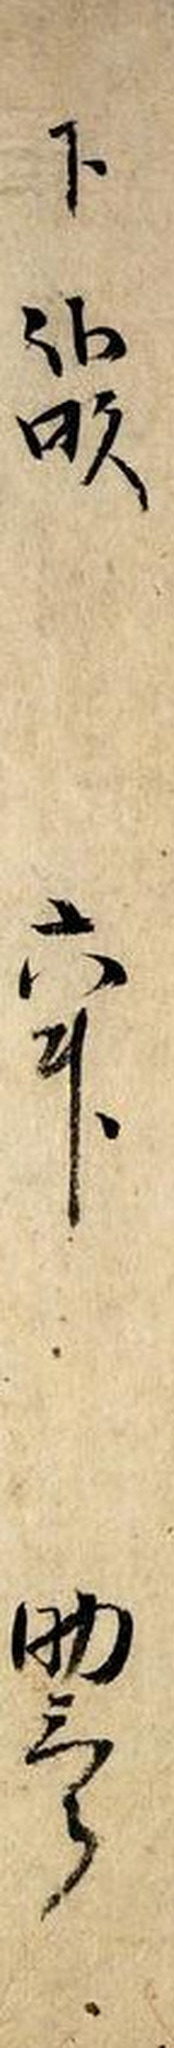下弐畝六升助三郎
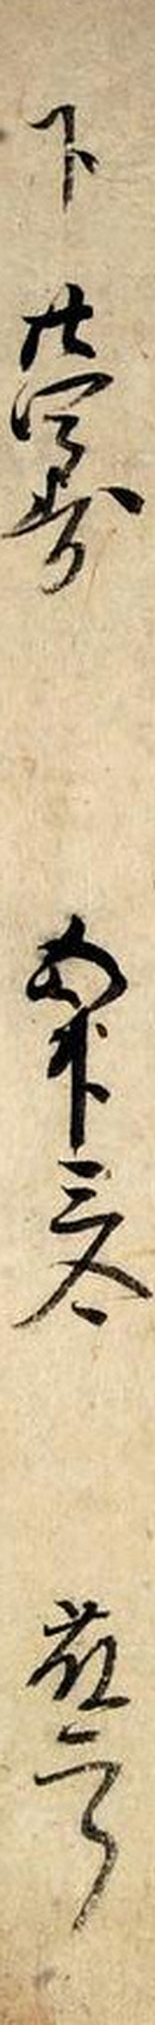下廿四歩五升三合藤二郎
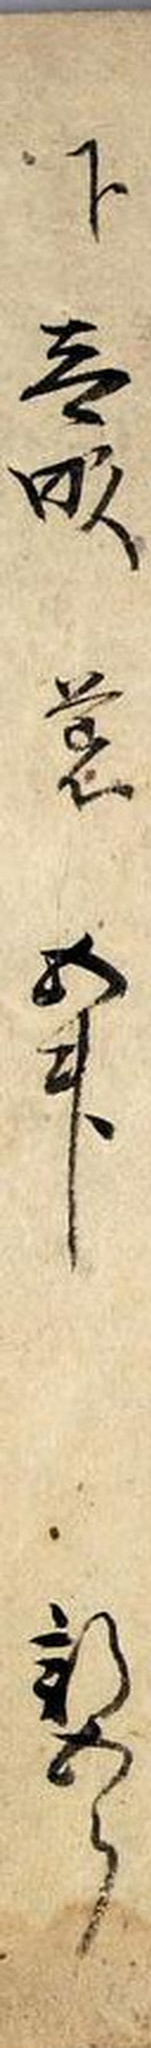下壱畝荒五升新五郎
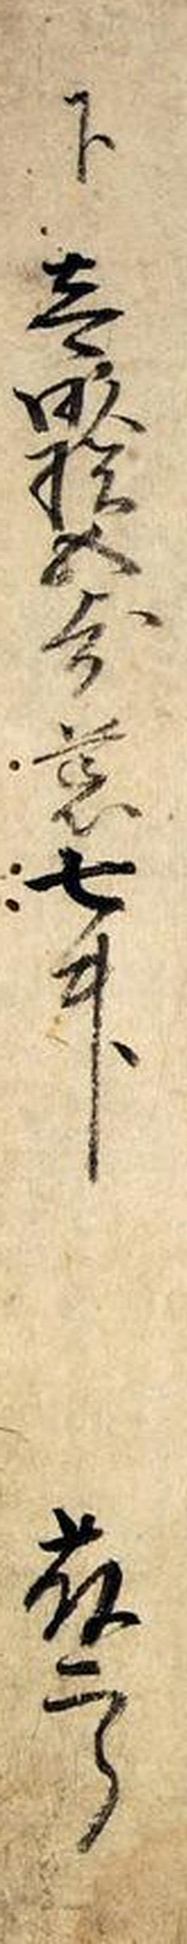下壱畝拾五歩荒七升藤二郎

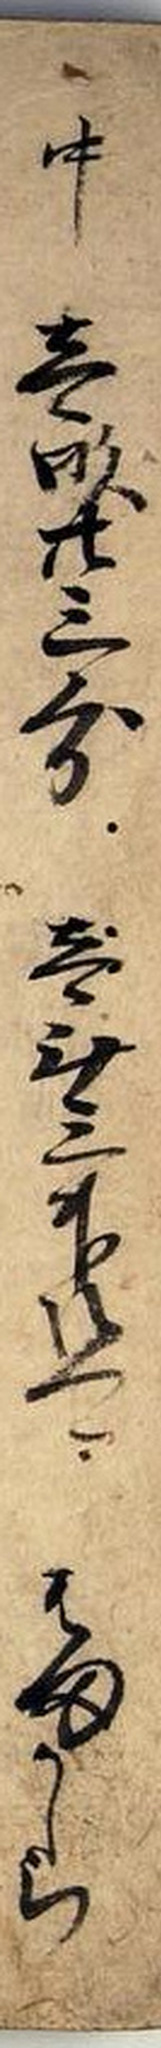中壱畝廿三歩壱斗三升八合はまかしら
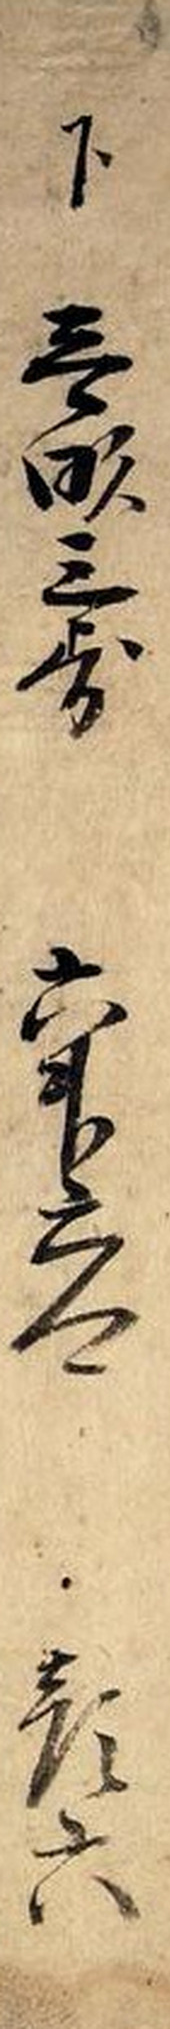下壱畝三歩六升六合彦六
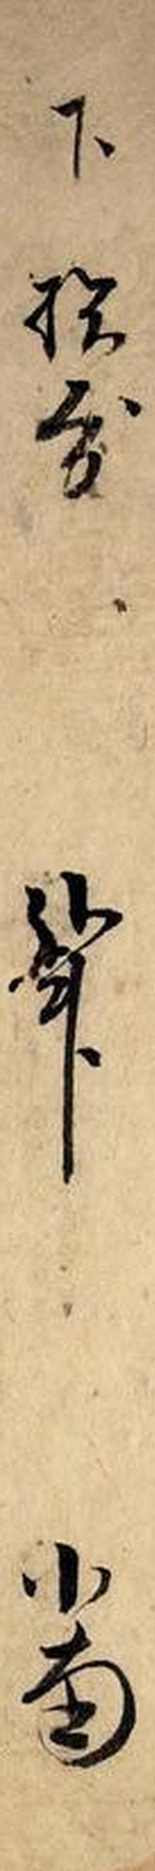下拾歩弐升小南
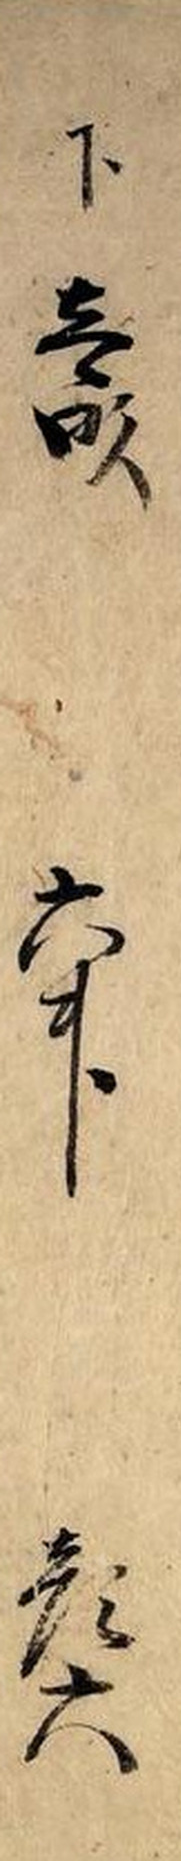下壱畝六升彦六
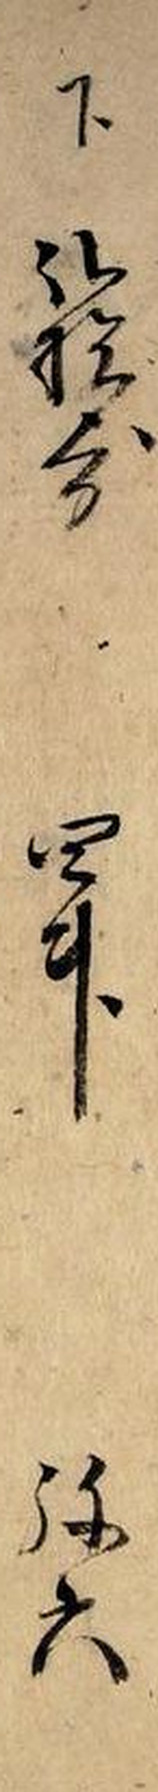下弐拾歩四升弥六
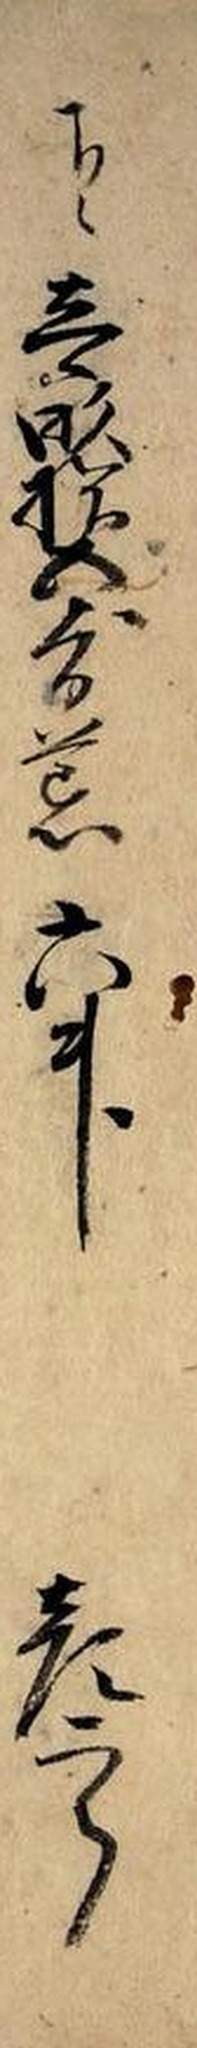下々壱畝拾五歩荒六升彦二郎
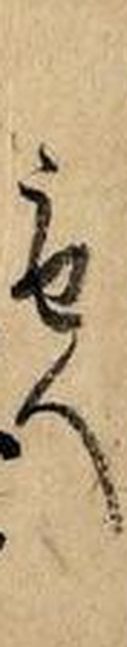うせ人
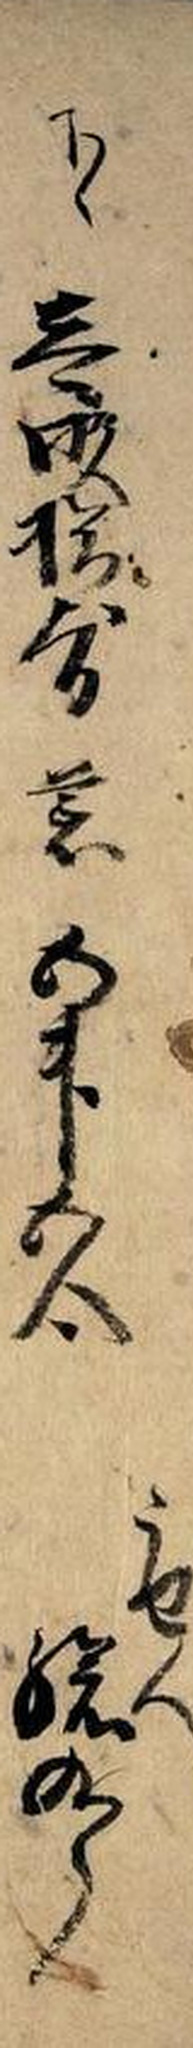下々壱畝拾歩荒五升五歩孫九郎
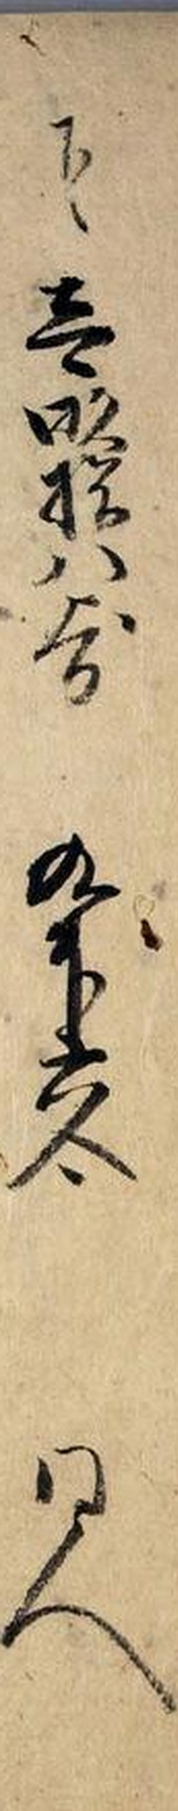下々壱畝拾八歩九升六合同人
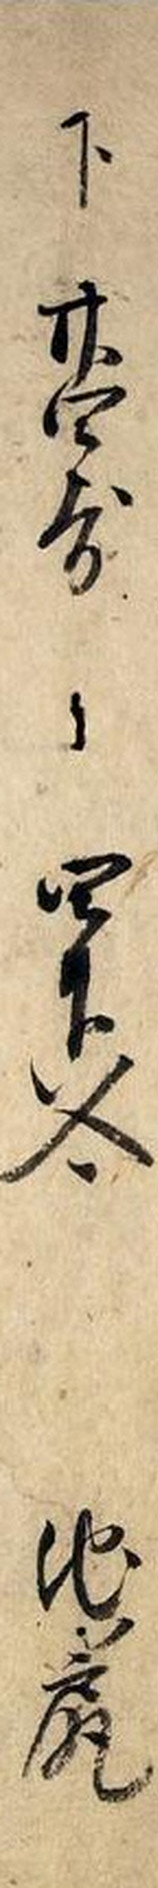下廿四歩四升八合池ノ尻
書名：若州三方郡之内世久見浦御検地帳（世久見浦検地帳写）
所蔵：福井県文書館 Fukui Prefectural Archives
